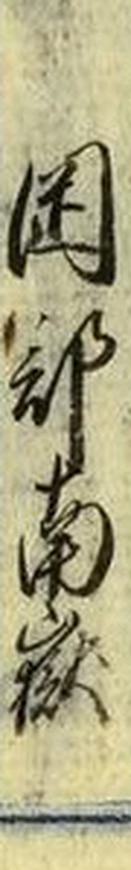岡部南嶽
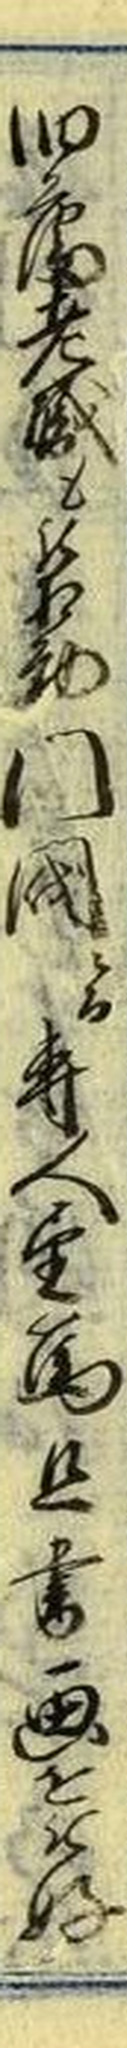旧藩老職も被相勤門閥に而専人望篤且書画を被好
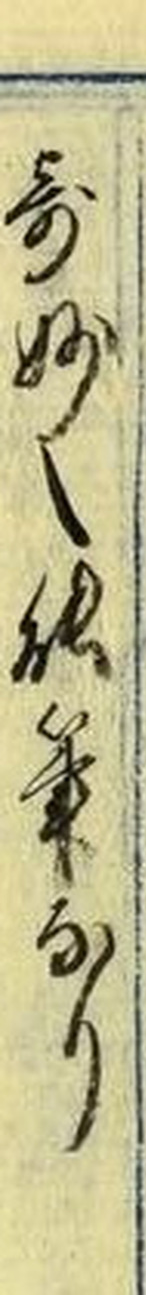奇妙之能筆なり
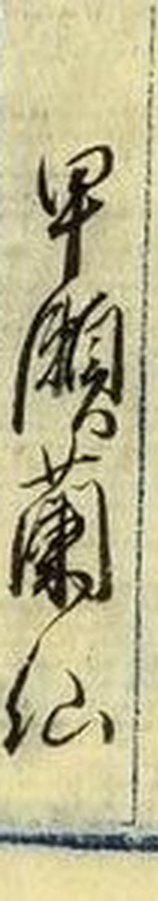早瀬蘭仙
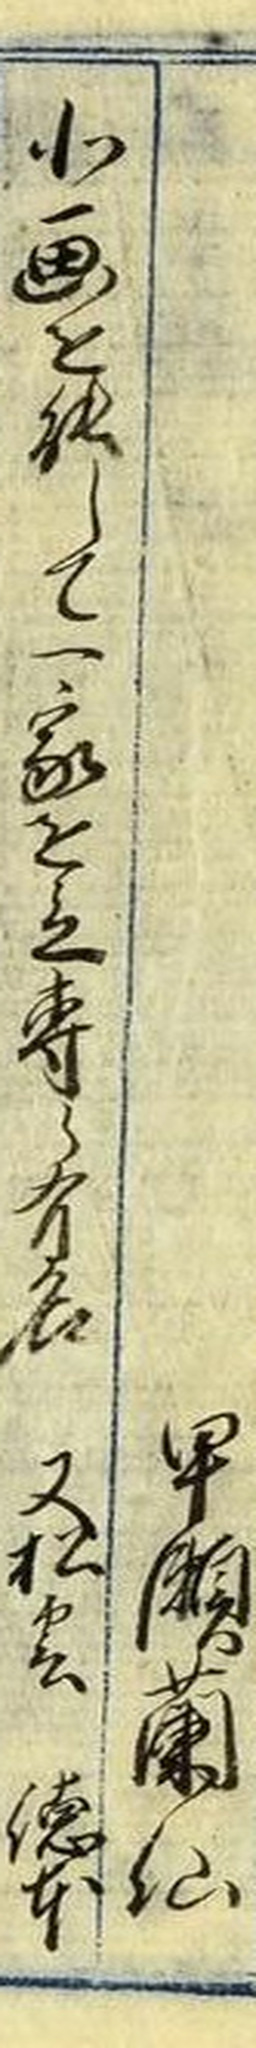北画を能して一家を立専ら有名又松雲徳本
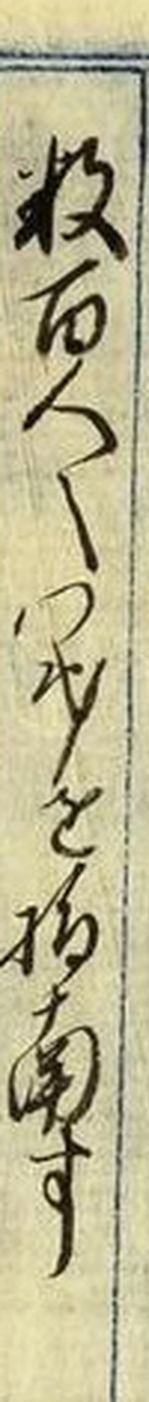数百人之門弟を指南す
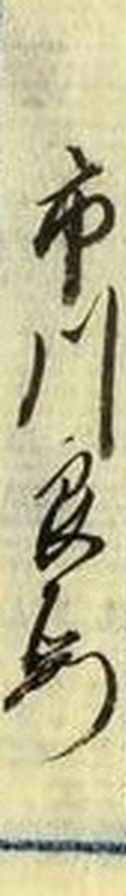市川良右衛門
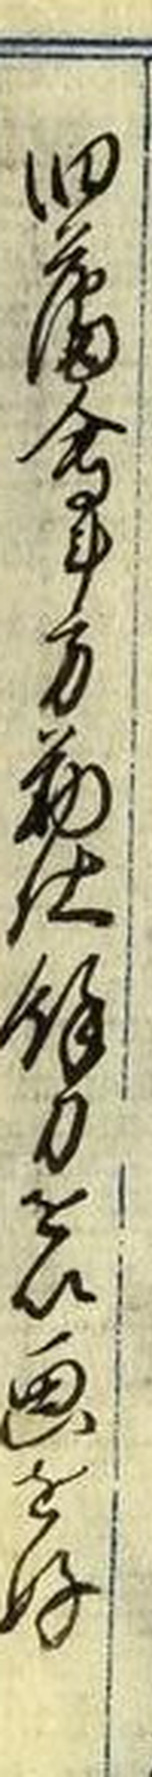旧藩会計方勤仕余力を以画を好
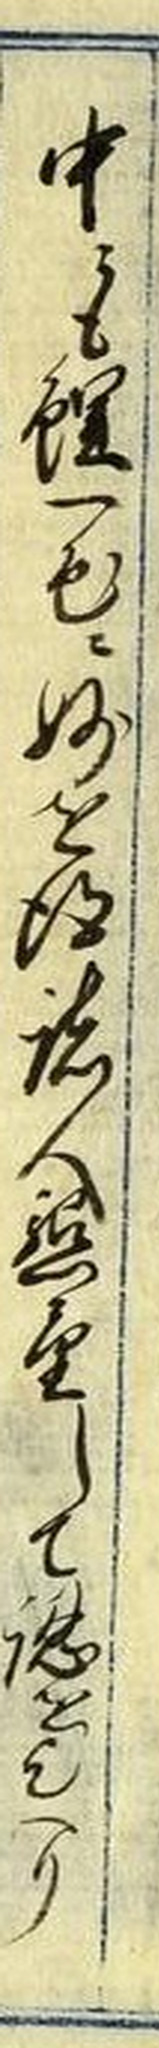中にも鯉一色に妙を得諸人懇望して認を乞へり
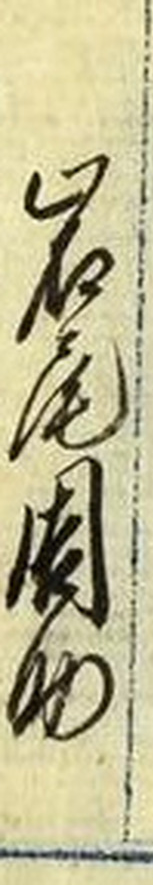岩尾周助
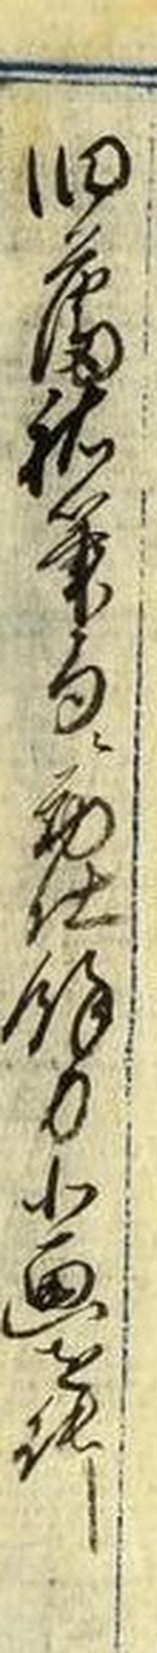旧藩祐筆局に勤仕余力北画を能し

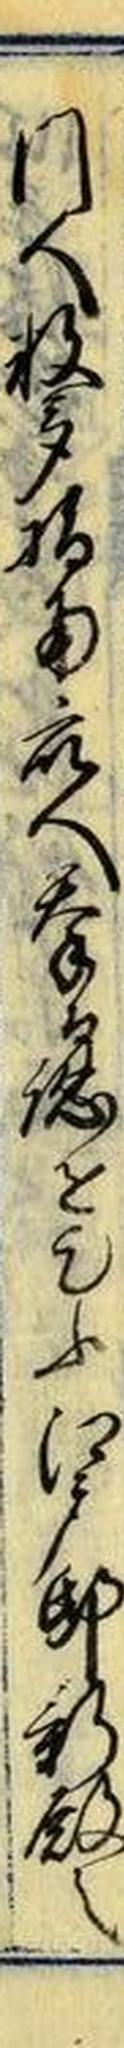門人数多指南衆人挙而認を乞ふ江戸邸新殿之
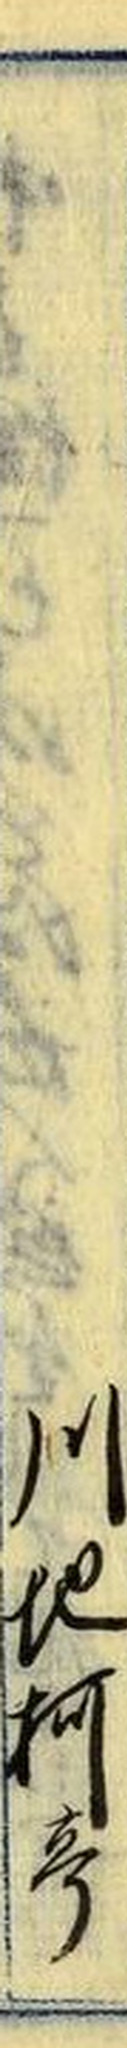川地柯亭
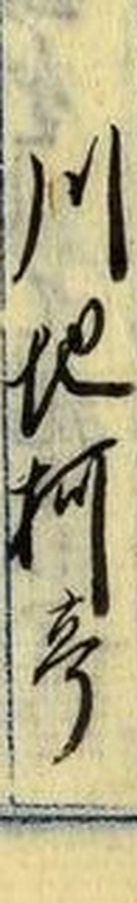川地柯亭
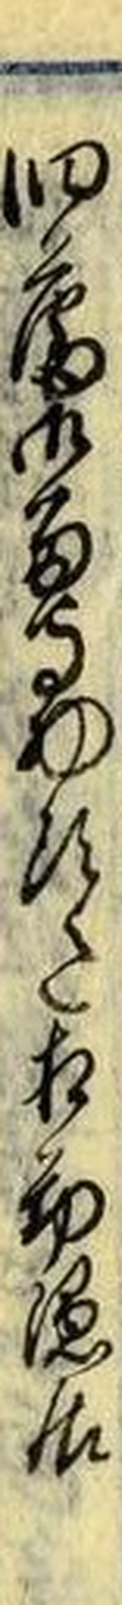旧藩御留守物頭迄相務隠居又兵衛
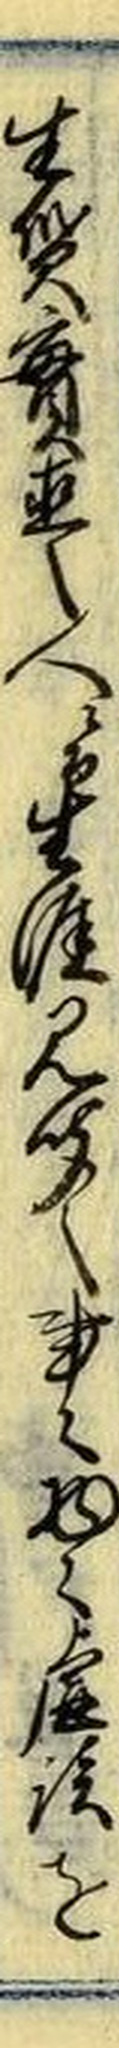生質実直之人に而生涯見分之事々物々虚談を
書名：温古集 四巻
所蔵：福井県文書館 Fukui Prefectural Archives
